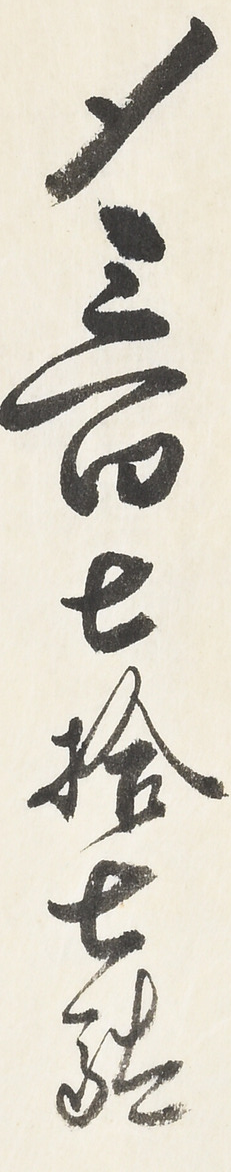〆三百七拾七駄

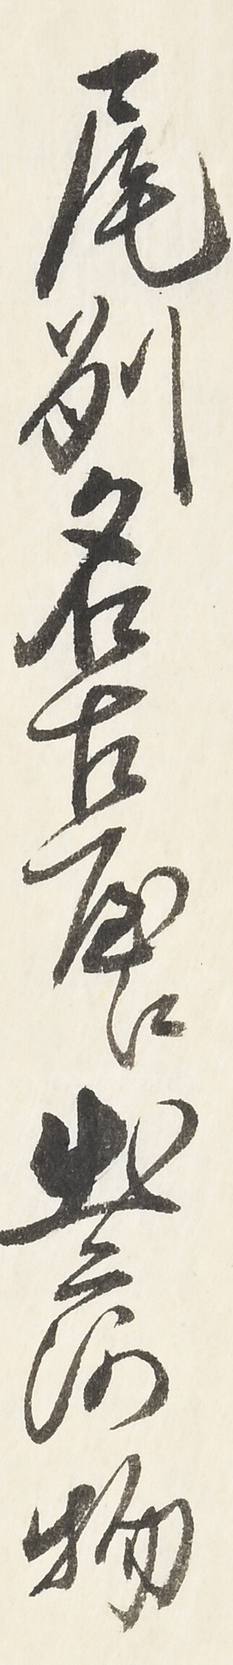尾州名古屋江出荷物
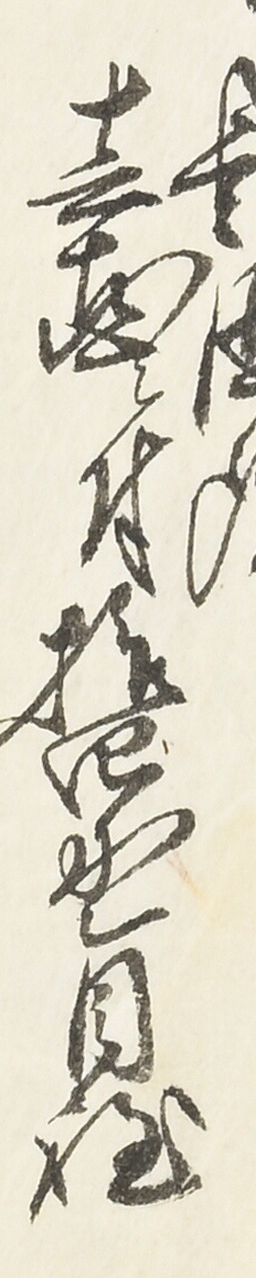壱固ニ付拾四貫目程
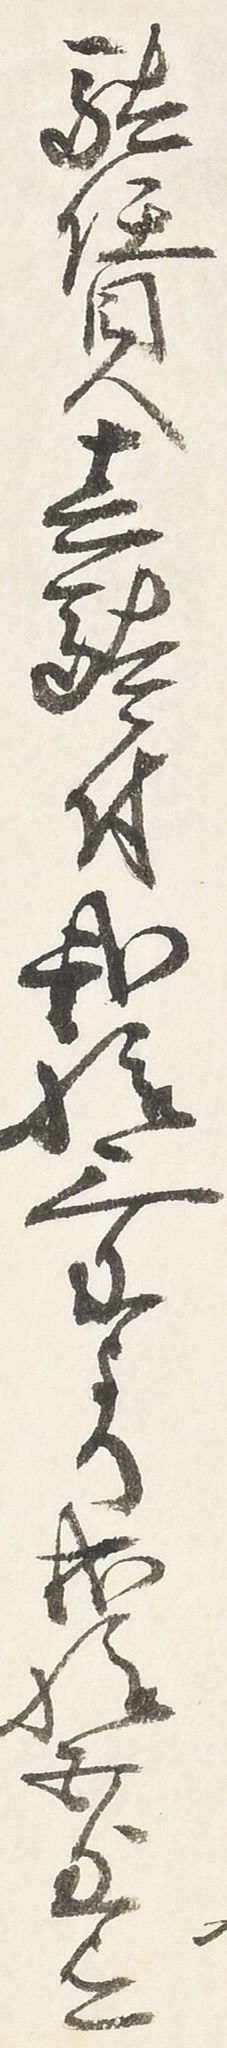駄賃壱駄ニ付弐拾三匁より弐拾五匁迄
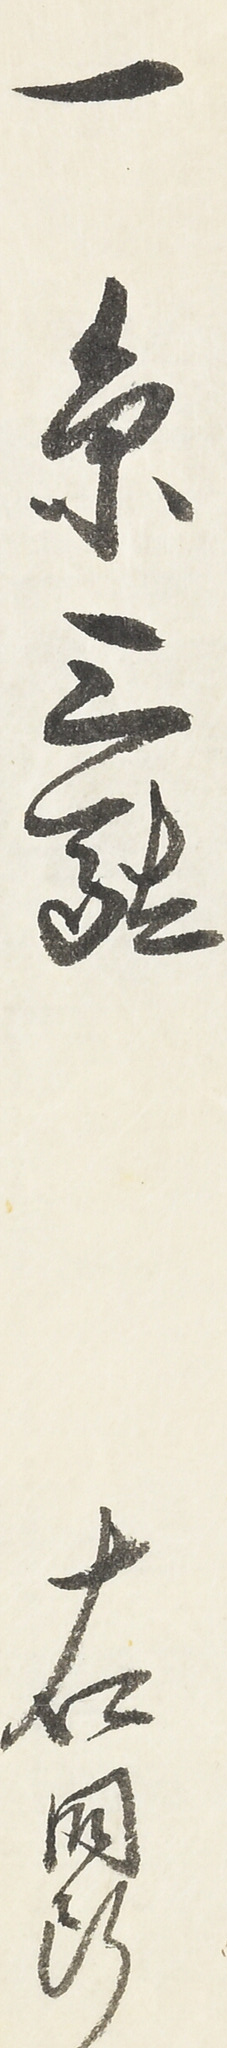一糸三駄右同断
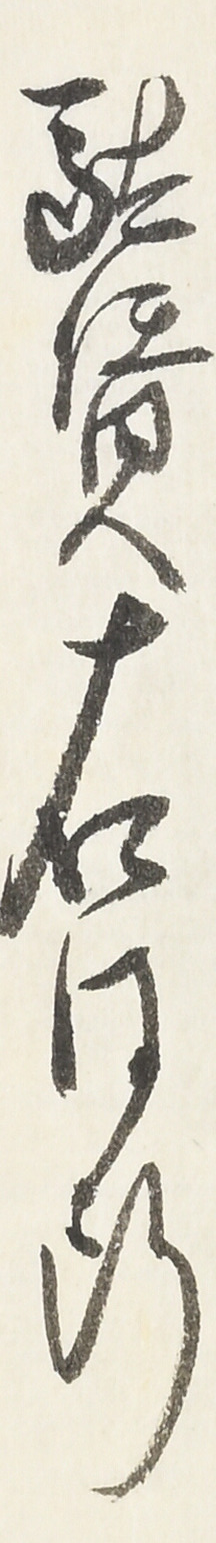駄賃右同断

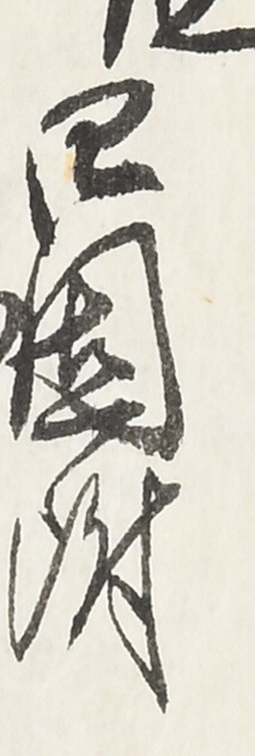四固附
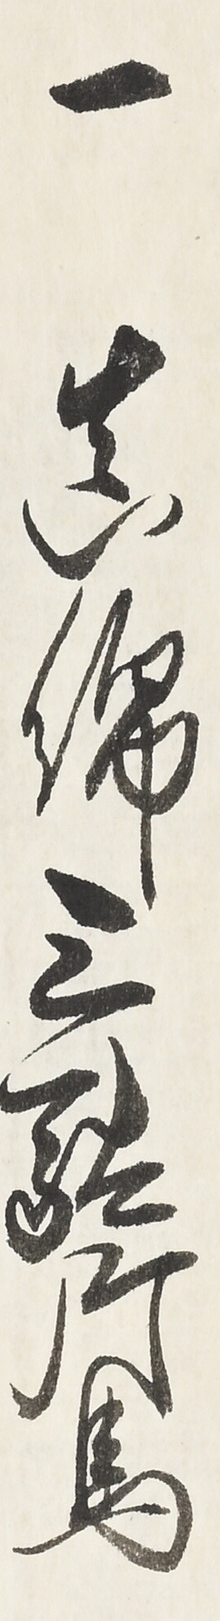一真綿三駄片馬但
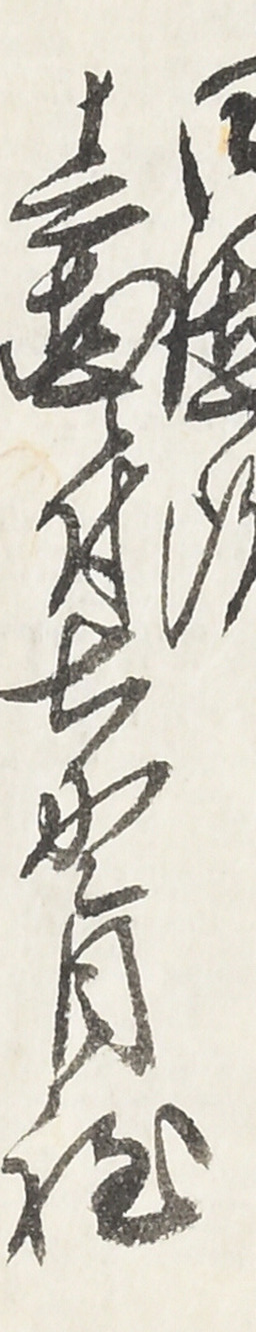壱固ニ付七貫目程
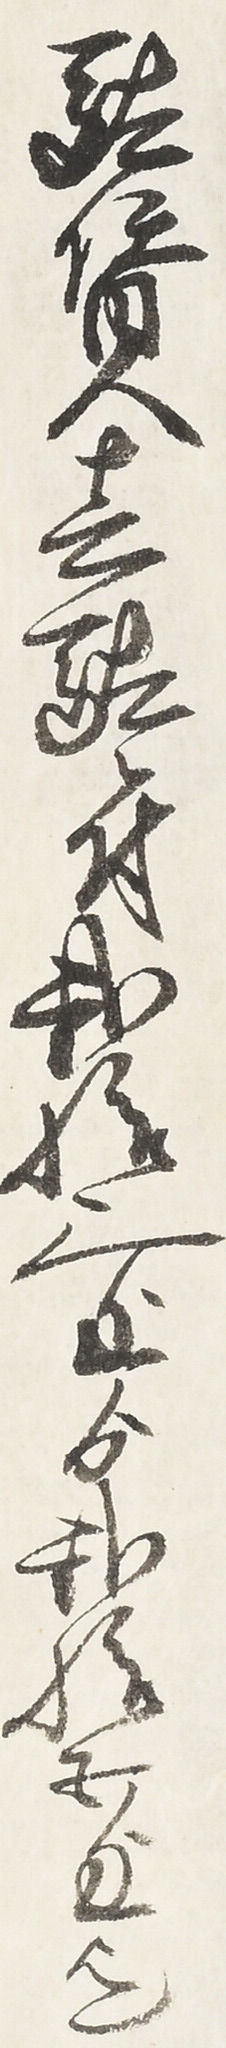駄賃壱駄ニ付弐拾三匁ゟ弐拾五匁迄
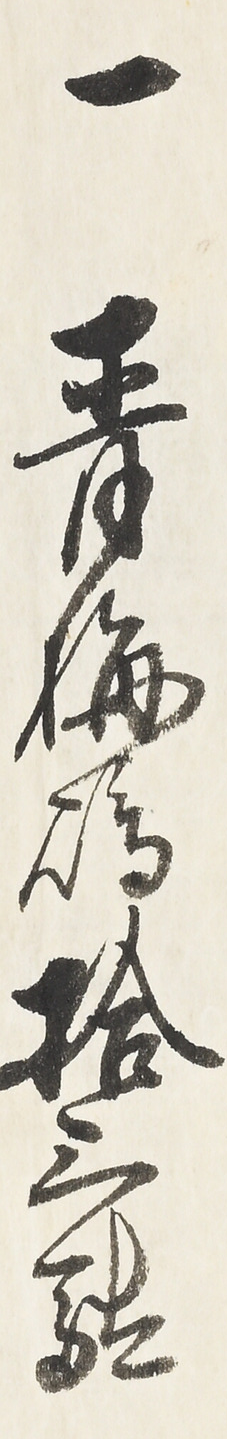一青梅嶋拾三駄但
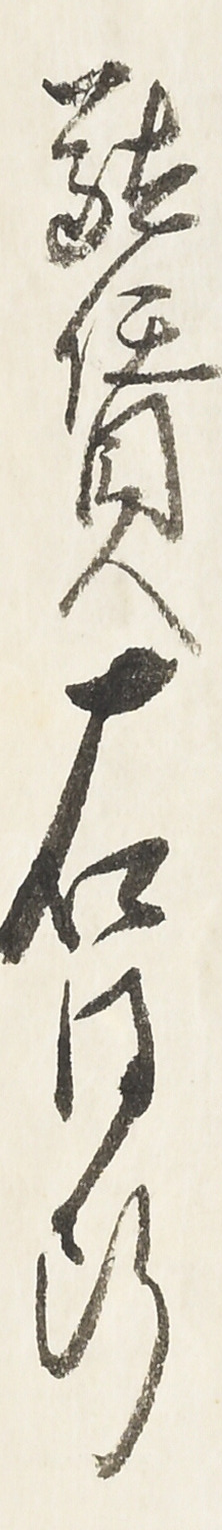駄賃右同断
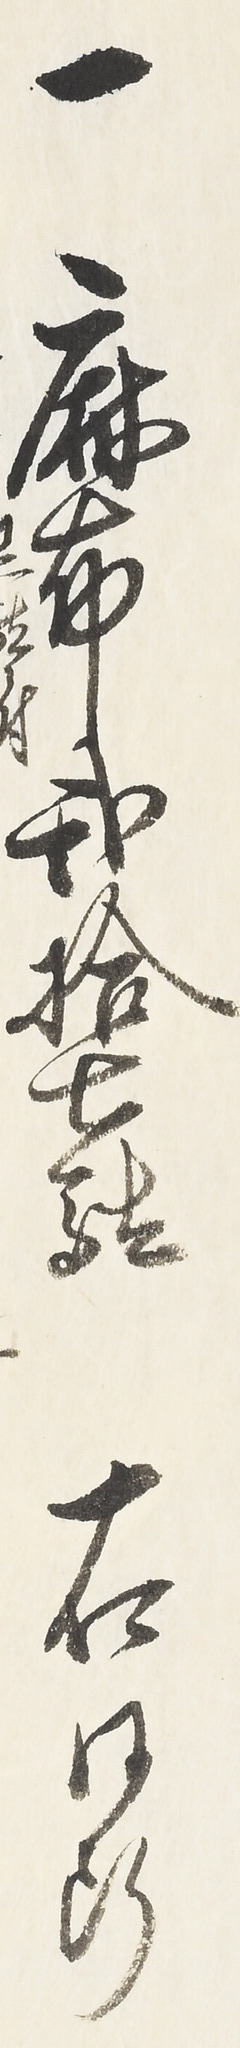一麻布弐拾七駄右同断
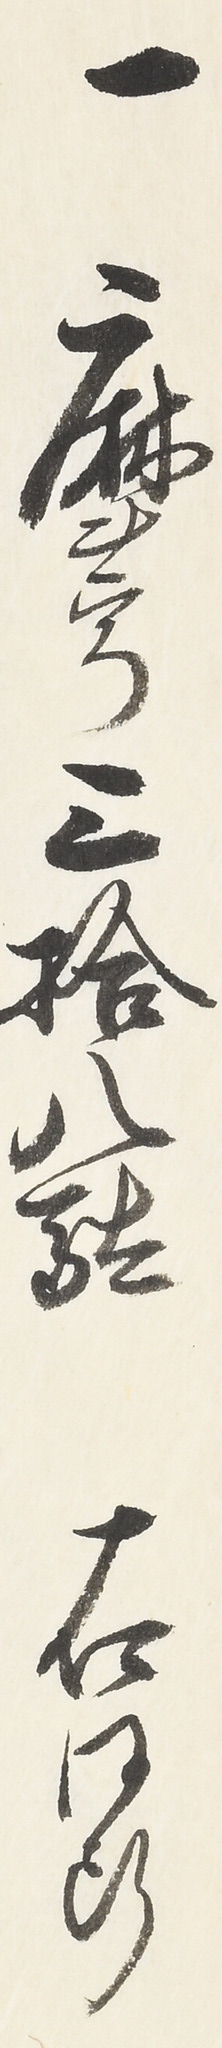一麻苧三拾八駄右同断
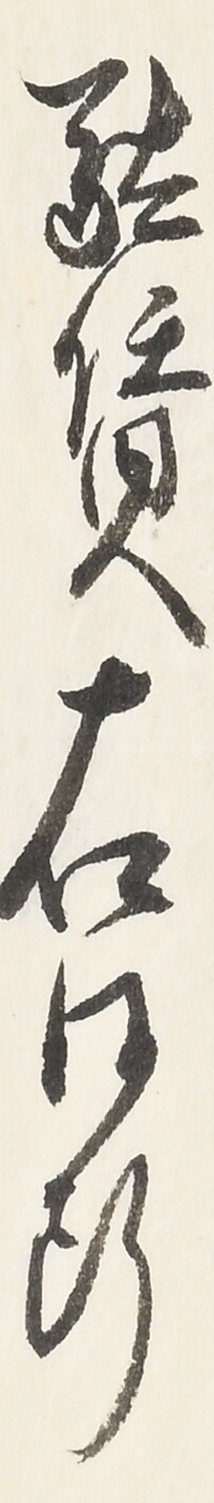駄賃右同断
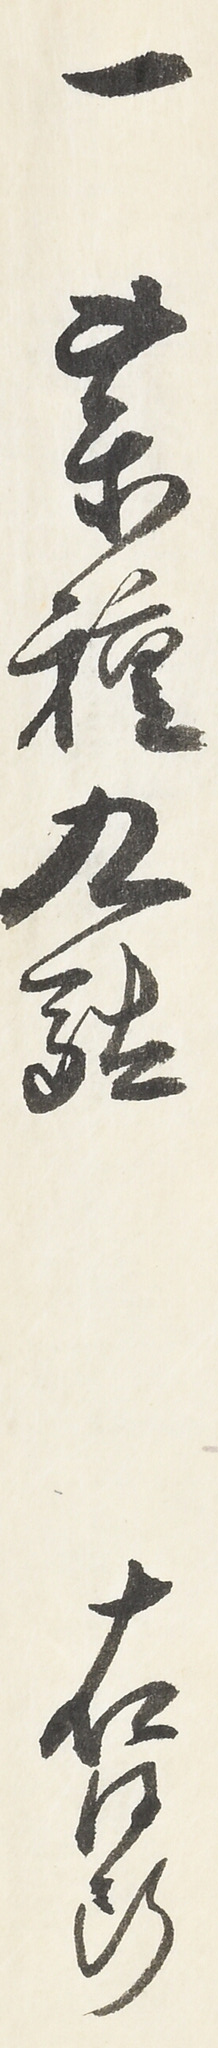一菜種九駄右同断
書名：中馬ニテ附通候出入荷物目録帳
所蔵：伊那市立高遠町図書館・合同会社AMANE
